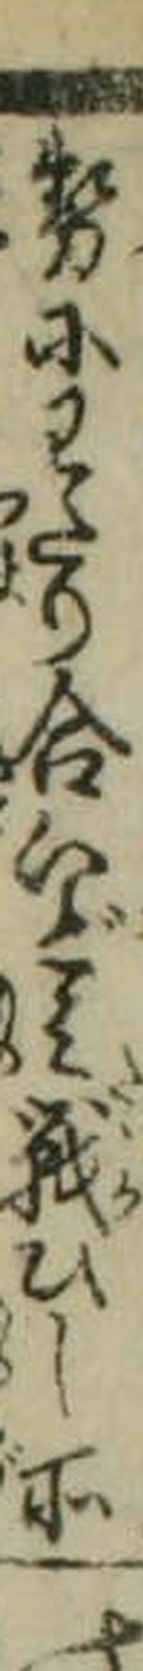勢にわたり合いどみ戦ひし所
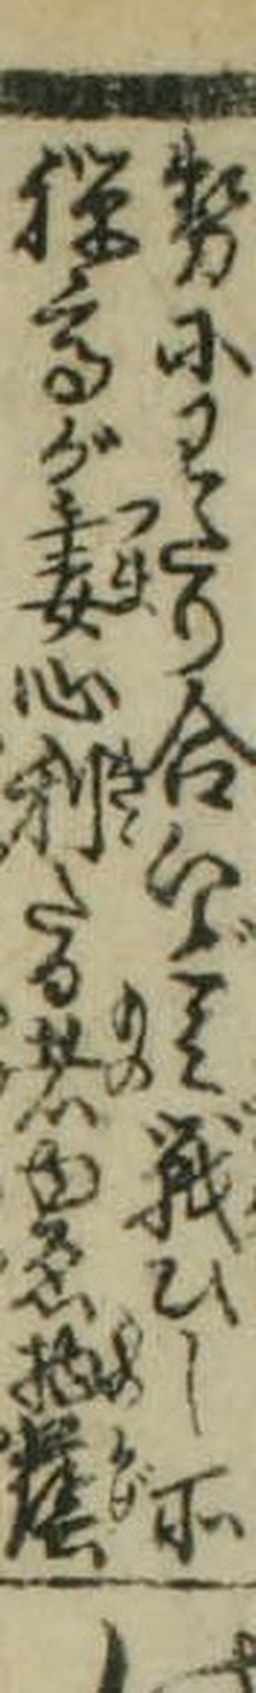禅高が妻心利たる者ゆゑ物蔭
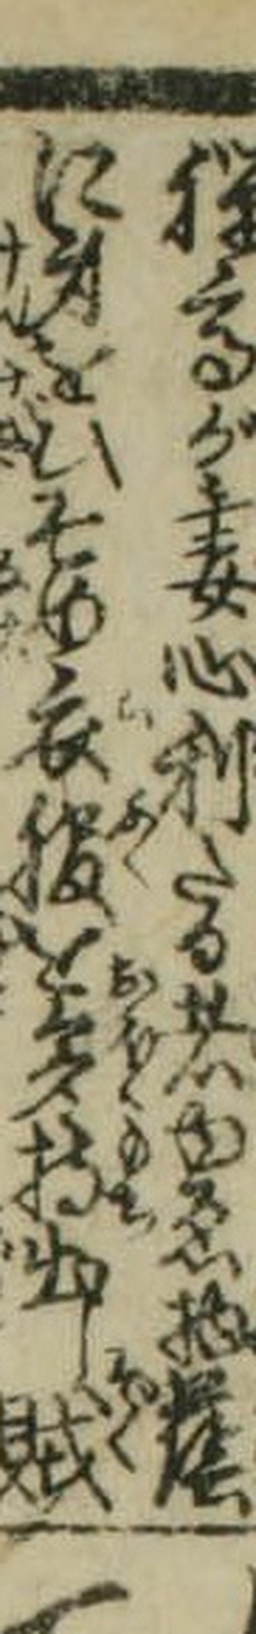に身をひそめ衣服を多持出し賊
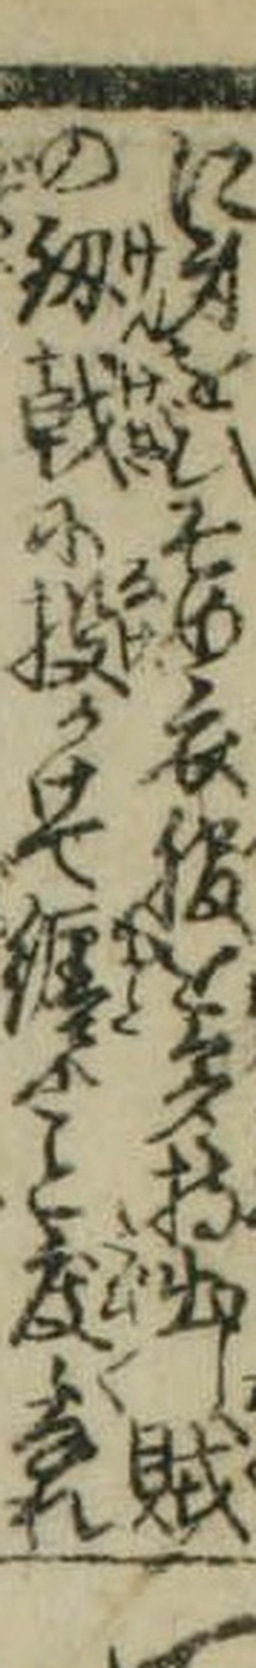の剣戟に投かけて纏ふこと度々なれ
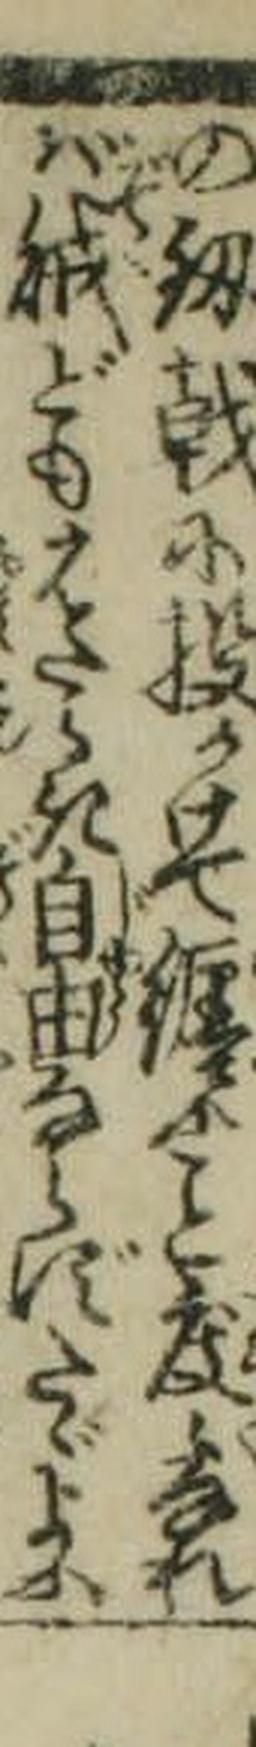ば賊どもはたらき自由ならずたゞよふ
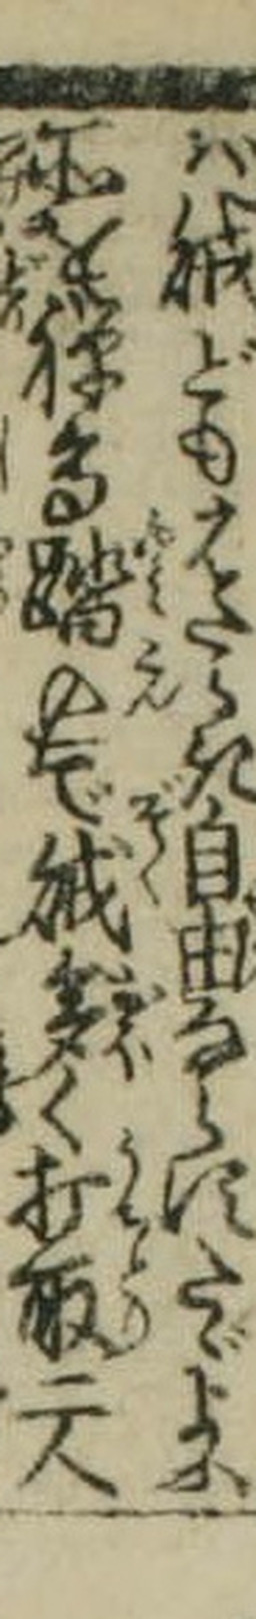所を禅高踏込で賊多く打取二人
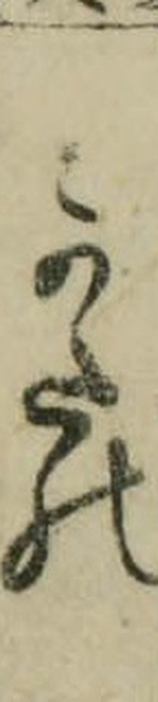かたの
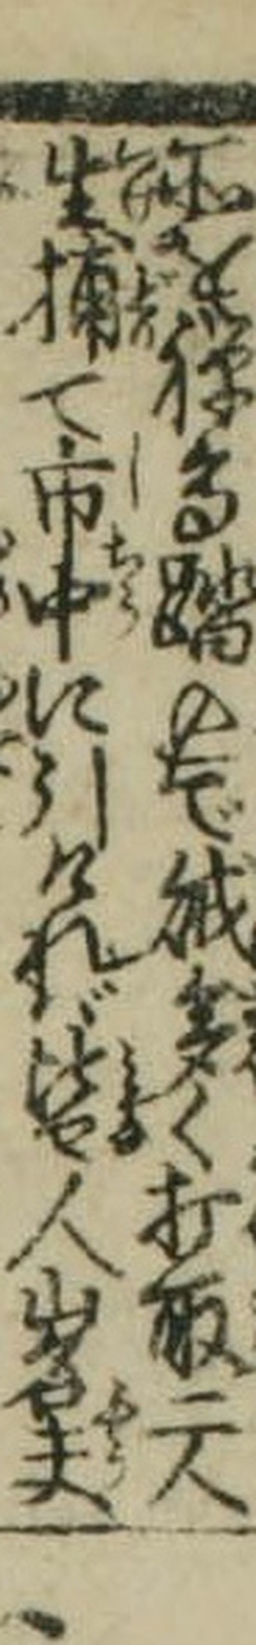生捕て市中に引ければ皆人山名夫
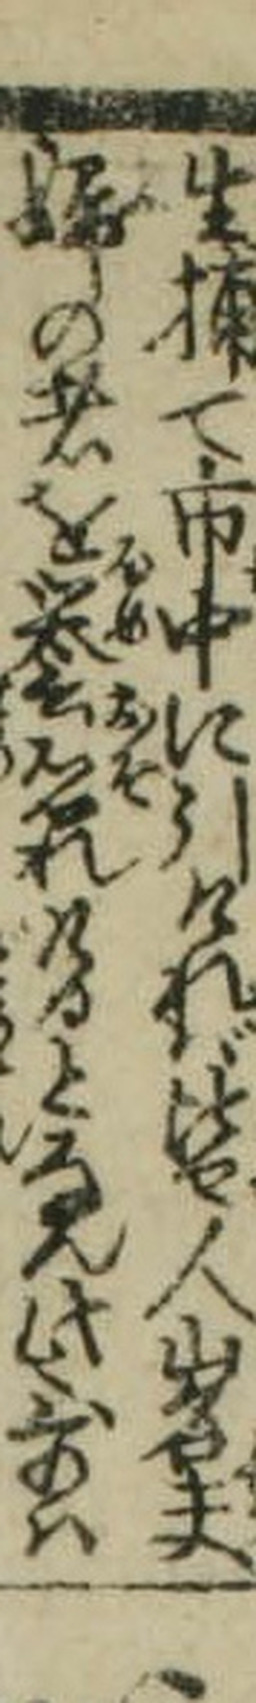婦の者を誉恐れけるとなん此哥は
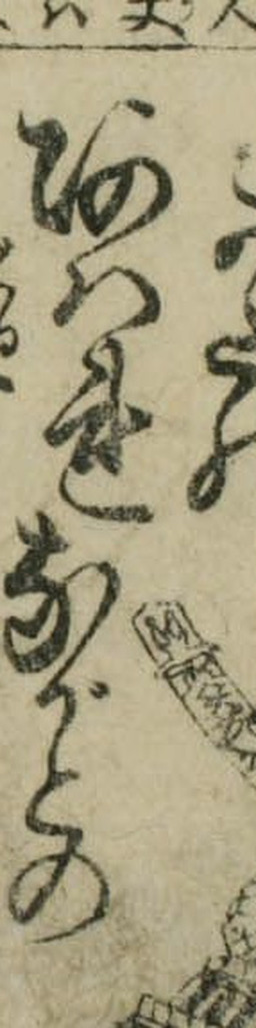あはれながとの
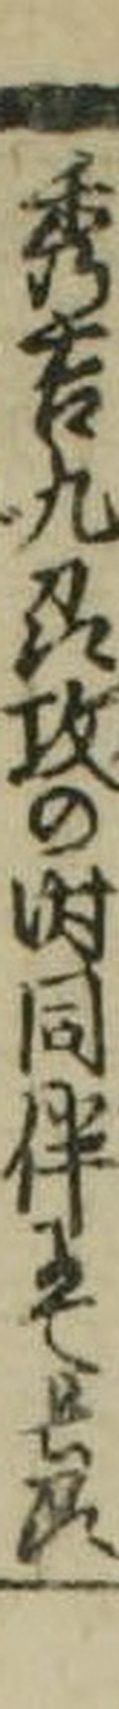秀吉九州攻の時同伴にて長州
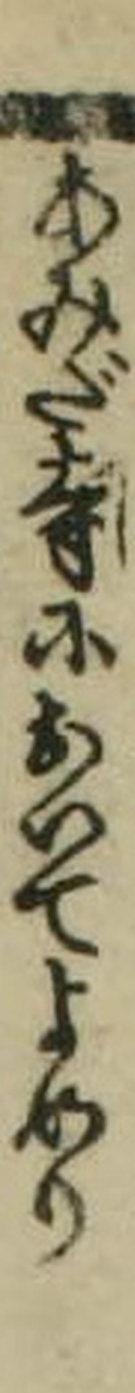あみだ寺においてよめり
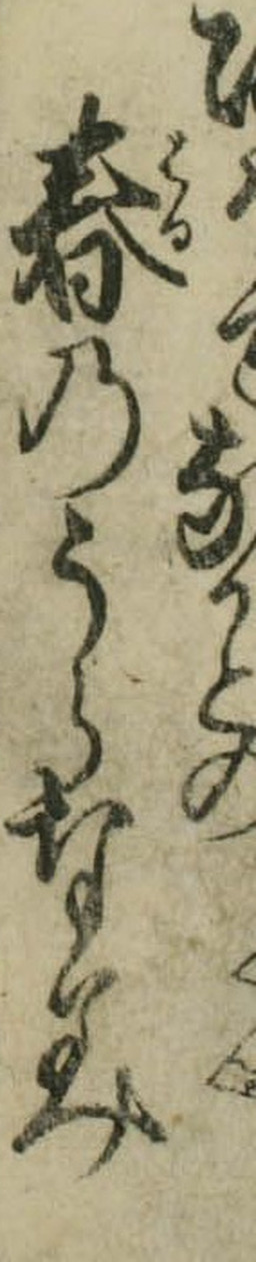春のうらなみ
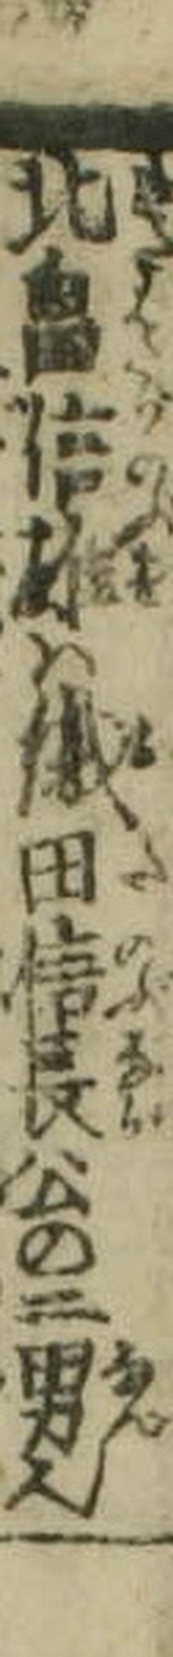北畠信雄は織田信長公の二男也
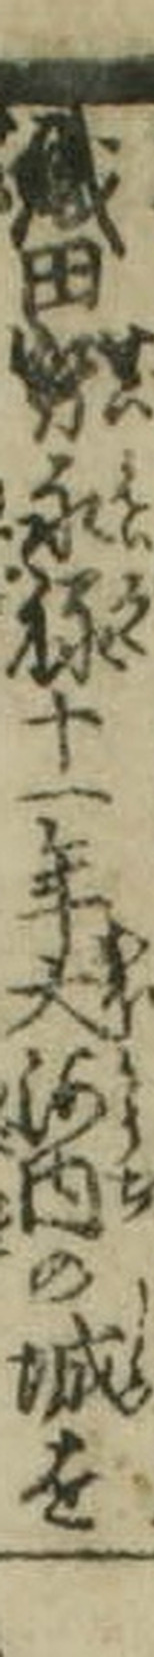織田勢永禄十一年大河内の城を
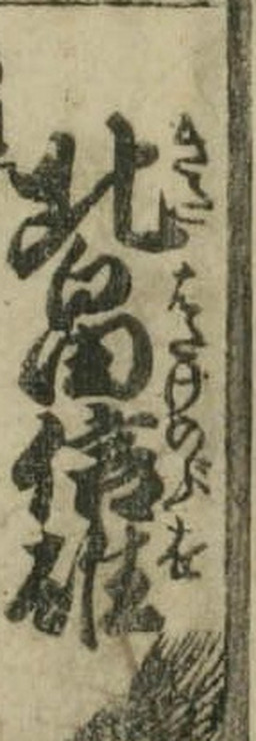北畠信雄
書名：續英雄百人一首
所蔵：東京学芸大学附属図書館
